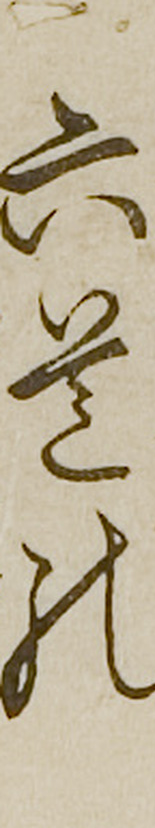六道の
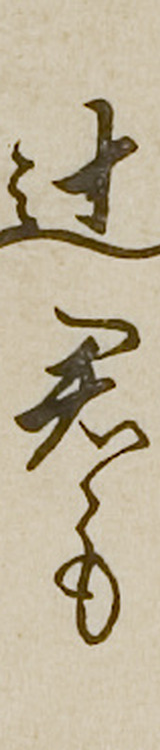辻君も
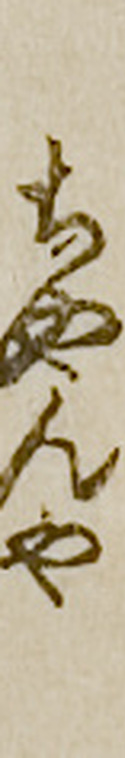ちやんや
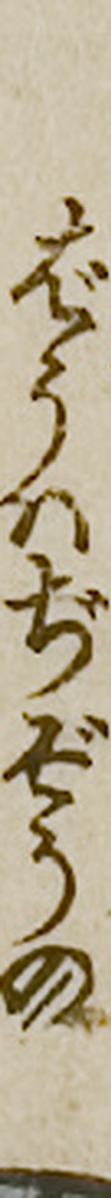ばうはぢぞうの
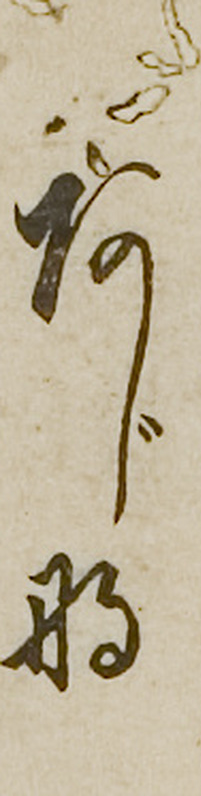あじな
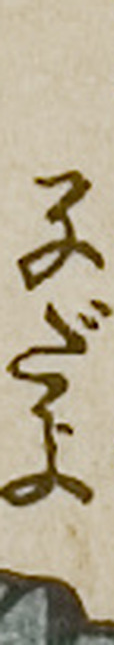子だよ
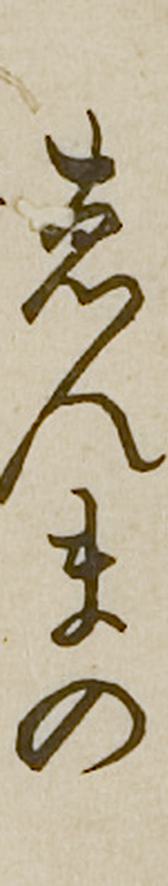ゑんまの
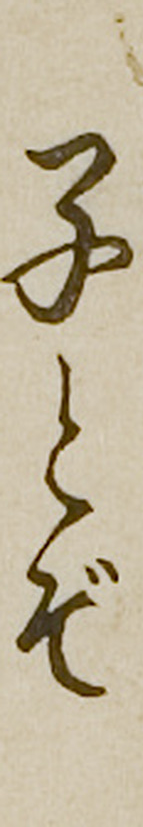子とぞ
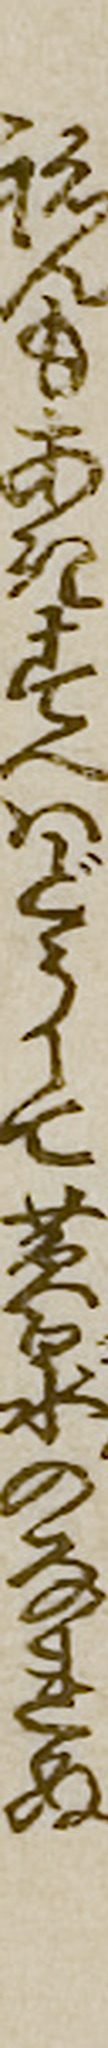ねんもあきすへはどうして黄泉のなれぬ
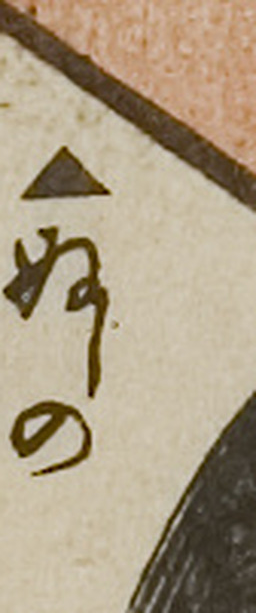ぬしの
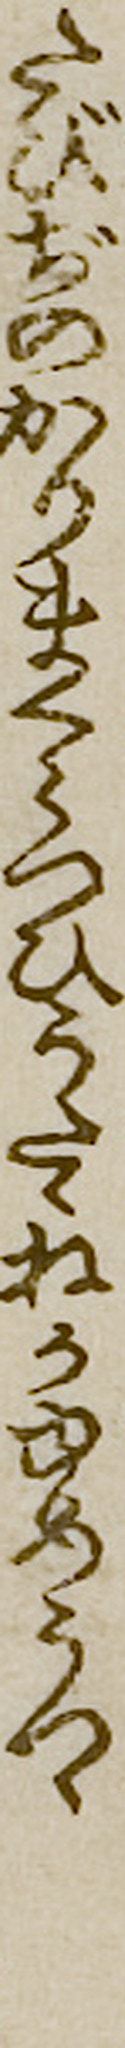たびぢのかりまくらつひうたゝねかゆめうつゝ
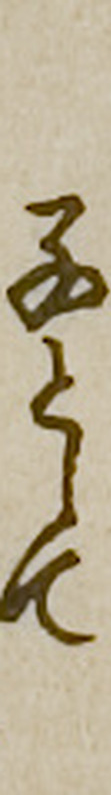子として
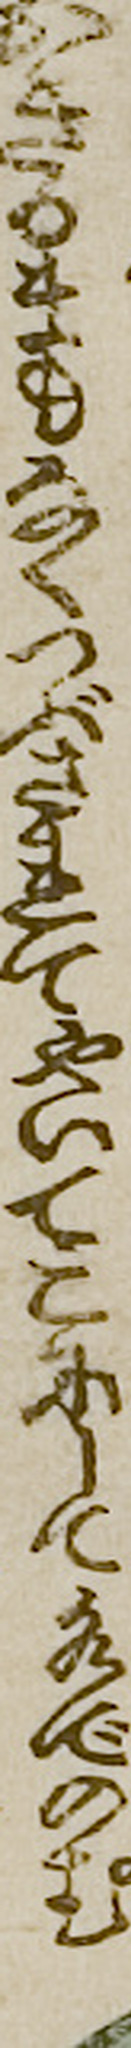おきるまもなくつぶされてやいてこにして水でのむ
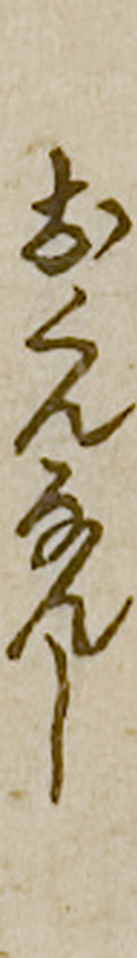おくんなんし
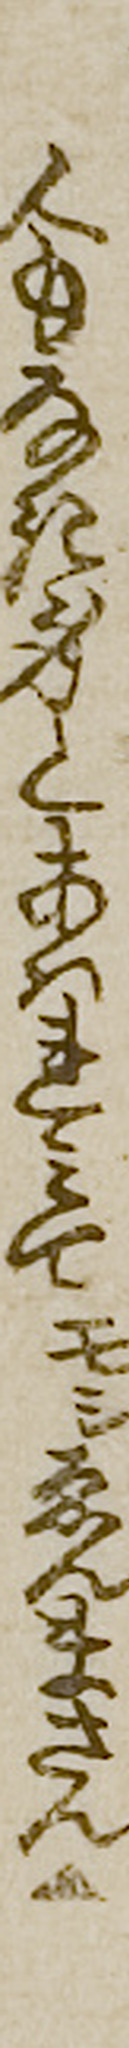人もなき身とあはれみてモシゑんまさん
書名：ゑんまの子
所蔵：東京大学総合図書館 General Library in the University of Tokyo, JAPAN
